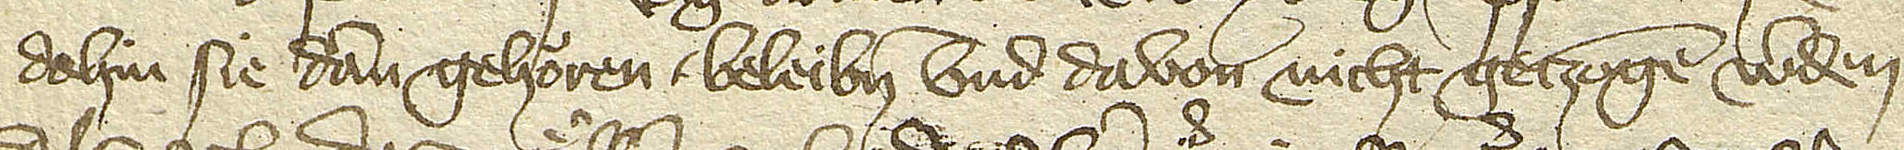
dahin ſie dan* gehören / beleibn* vnd davon nicht gecʒoge* w*den
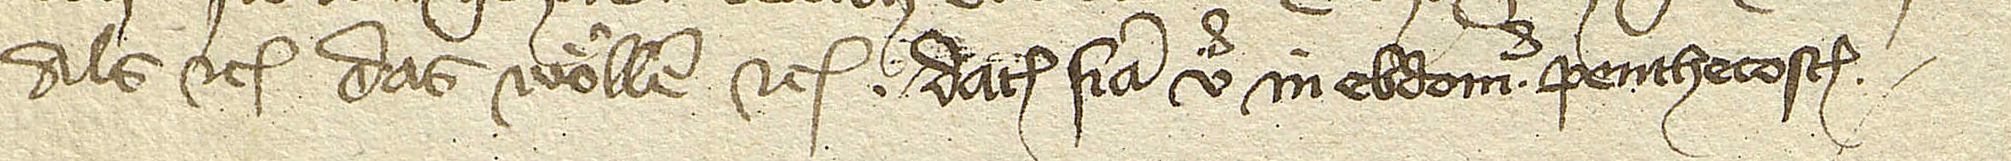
Als ec* Das wölle* ec* . / dat* fia* ṽ* in ebdom*. penthecoſt* . /
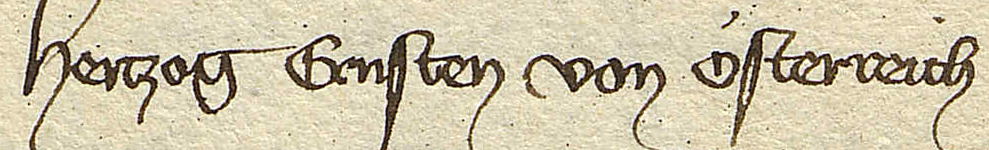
hercʒog Ernſten von Öſterreich
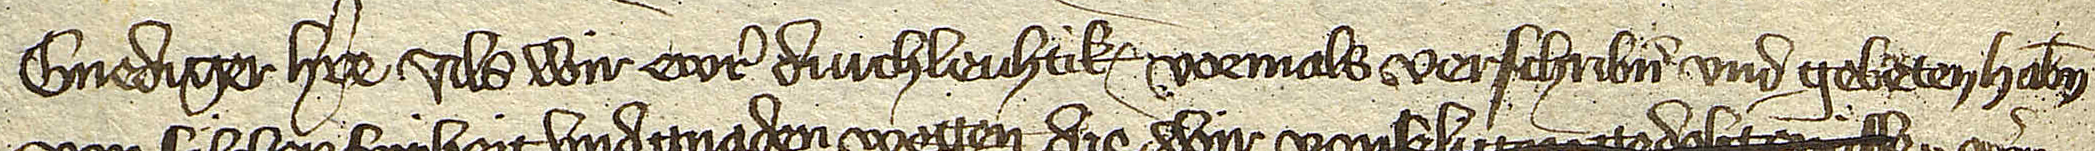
Gnediger h*re / Als wir ewr* durchleuhtik* voemals verſchribn* vnd gebeten habn*
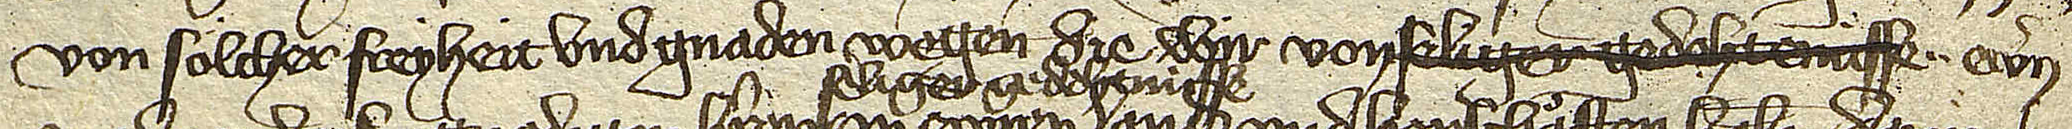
von ſölcher freyheit vnd gnaden wegen die wir von ſeliger gedehtenüſſe ~ ew*n
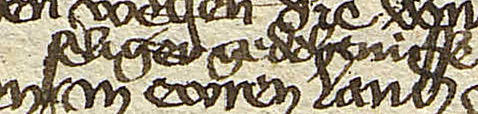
ſeliger gedehtnüſſe
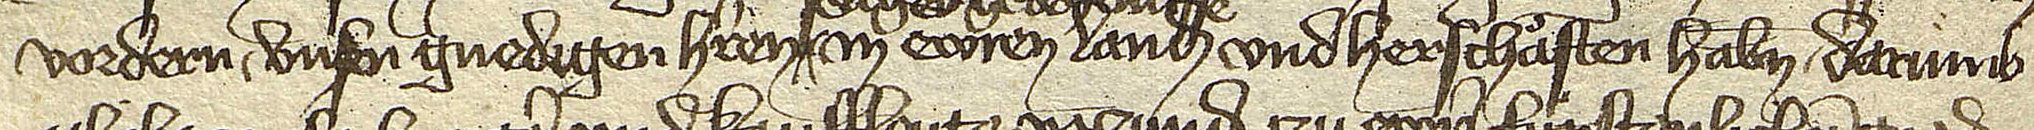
vordern / vnſ*n gnedigen h*ren in ewren land* vnd herſchäften habn* / darümb
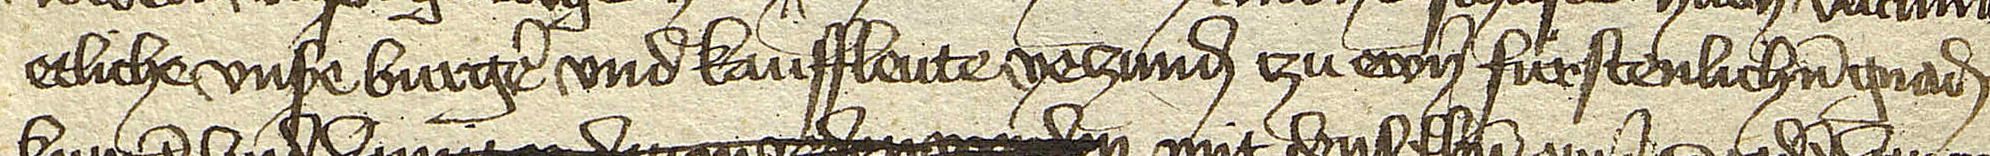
etliche vnſ*e burge* vnd kauffleute yecʒund* cʒu ewn* fürſtenlichn* gnad*
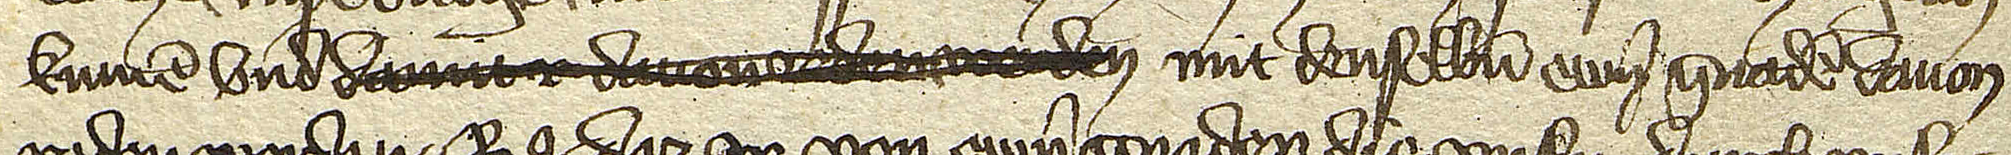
kume* vnd damit % dauon reden werden mit denſelbn* ewn* gnade* dauon
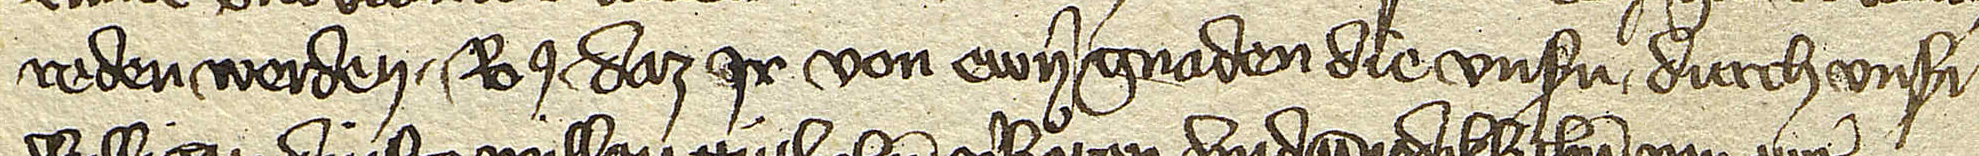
reden werden / Ro* / daʒ Ir von ewn* gnaden die vnſ*n / durch vnſ*r
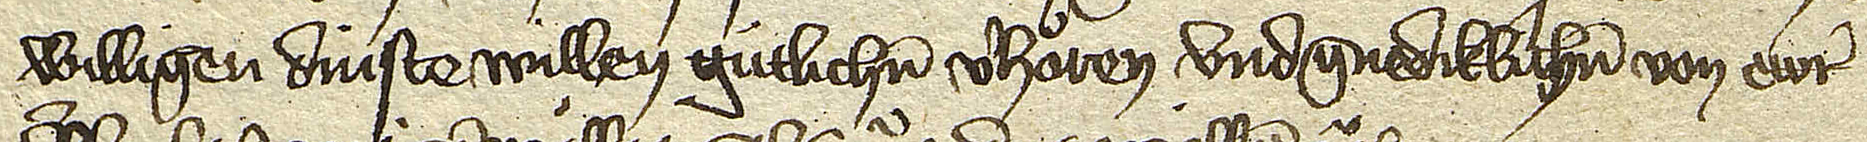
willigen dinſte willen gütlichn* v*hören / vnd gnediklichn* von ewr*
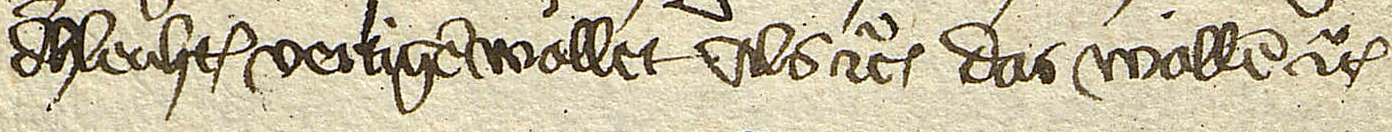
d*hleuht* vertige* wöllet Als ec* das wölle ec*
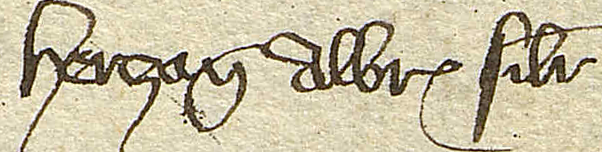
hercʒog Albr* ſilr*
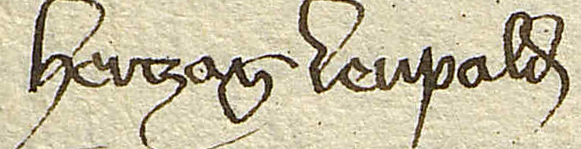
hercʒog Leupold*
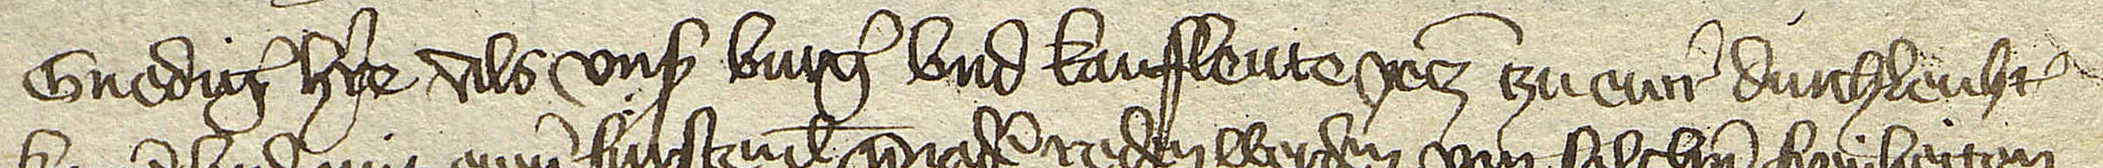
Gnedig* h*re / Als vnſ* burg* vnd kauffleute yecʒ* cʒu ewr* durchleuht*
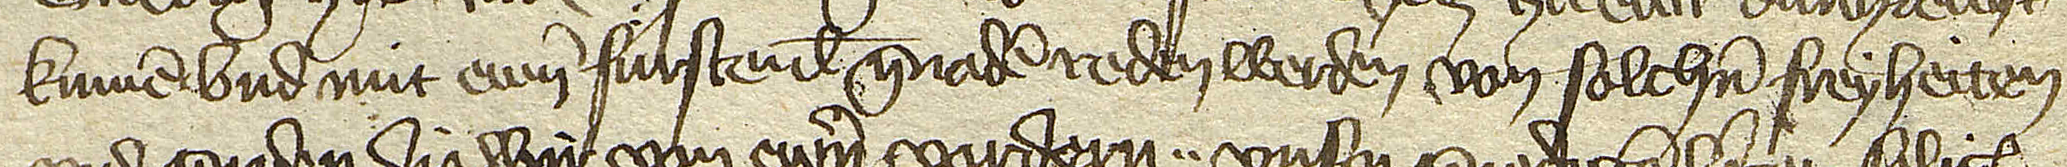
kume* / vnd mit ewn* fürſtenl* gnad* reden werden von ſolchn* freyheiten
